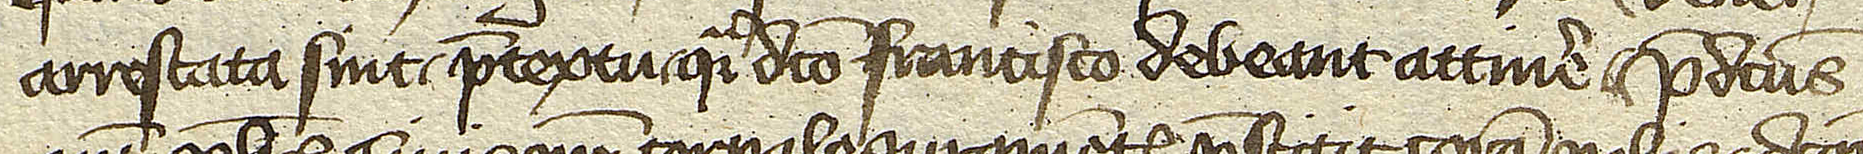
arreſtata ſint / p*textu / q* d*c*o Franciſco debeant attine* / P*d*c*us
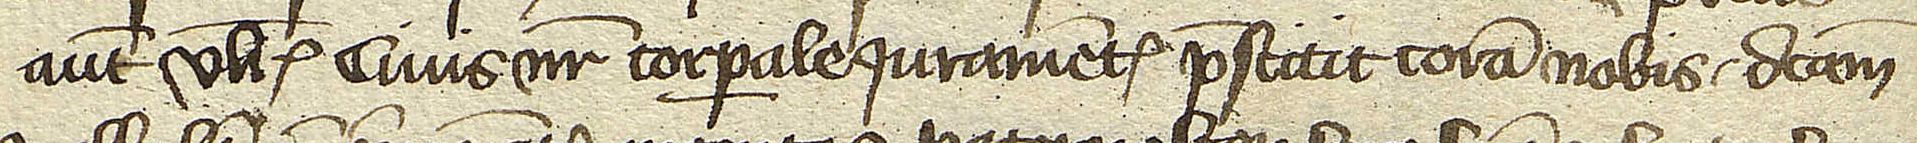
aut* Vlr* Ciuis n*r corp*ale Iurame*t* p*ſtitit cora* nobis / d*c*am
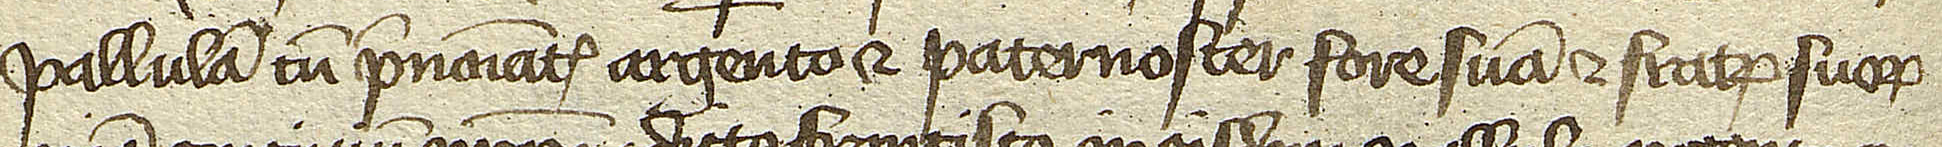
Pallula* cu* p*no*i*at* argento @ paternoſter fore ſua* @ fratr* ſuor*
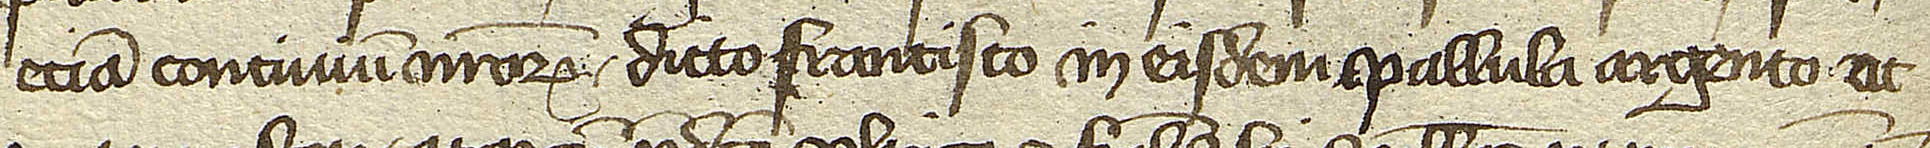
etia* conciuiu* n*ror* / dicto Franciſco in eiſdem Pallula argento ac
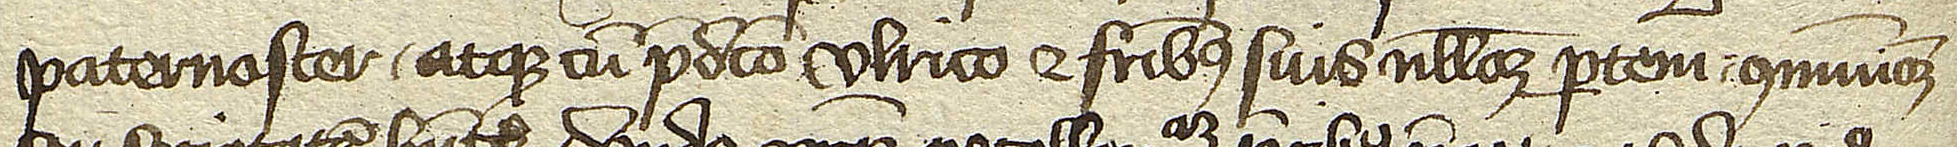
paternoſter / atq* cu* p*d*c*o Vlrico @ fr*ib* ſuis n*lla* p*tem / *m*ni*
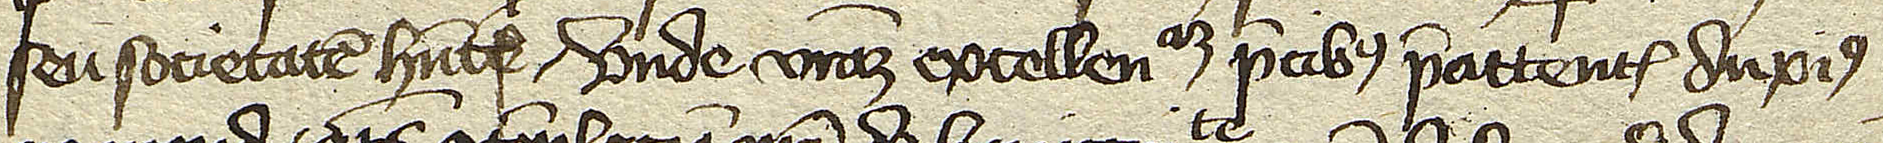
ſeu ſocietate* h*nte / Vnde v*ra* excellen* p*cib* p*attent* duxi*
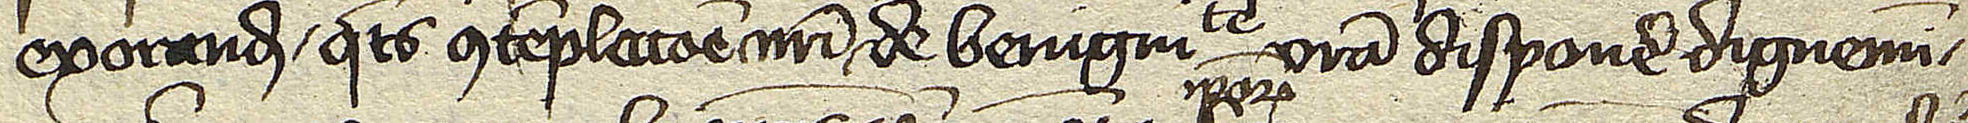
exorand* / q*t*s *te*plat*o*e n*ri / de benigni*te / v*ra diſpone* dignemi* /
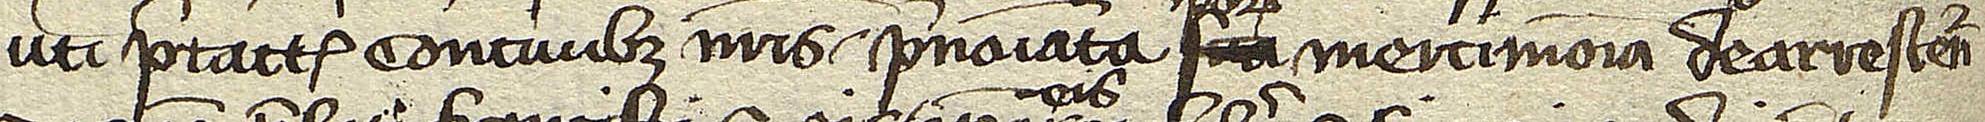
uti p*tact* Conciuib* n*ris / p*no*i*ata ſua mercimo*ia dearreſten*
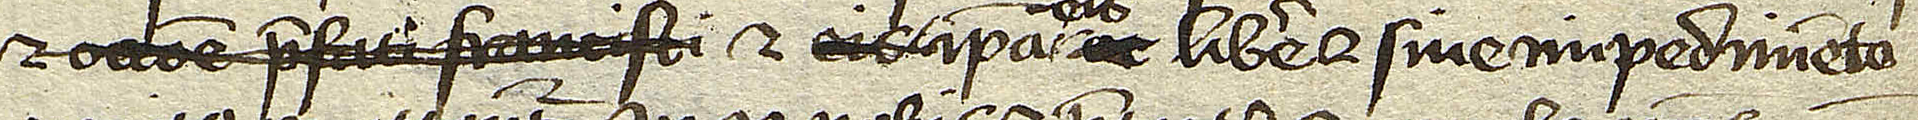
@ occoe* p*fati* franciſci @ eis ip*a et libe* @ ſine impedime*to
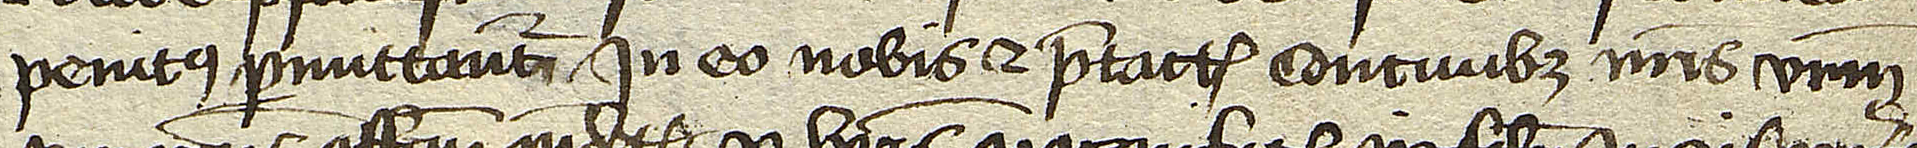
penit* p*mittant* / In eo nobis @ p*tact* Conciuib* n*ris v*r*m
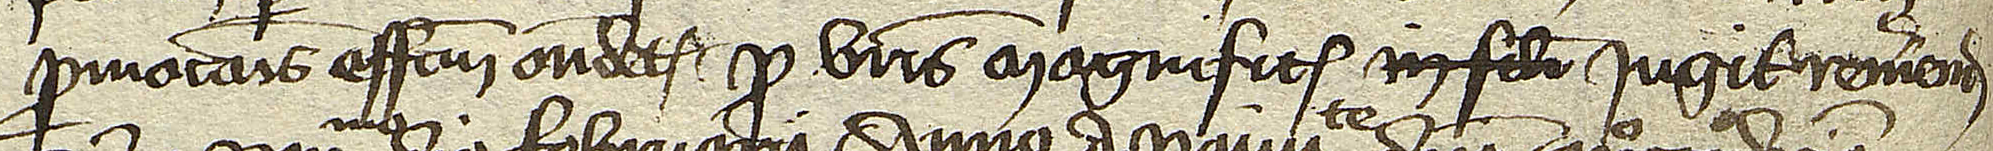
p*mot*n*s effc*m o*ndet* / p* v*ris magnifit* in ſil Iugit* reme*nd*
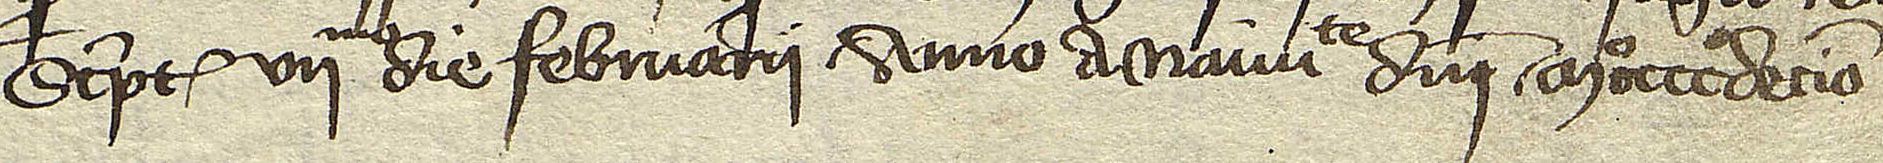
Sc*pt* vii* die februarii / Anno a na*ivi* d*ni M*cccc* deci*o
